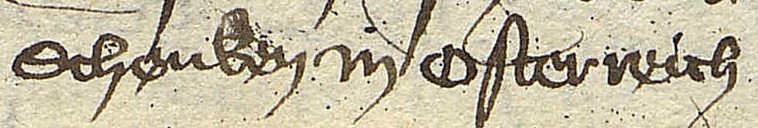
Schenken in Oſterreich
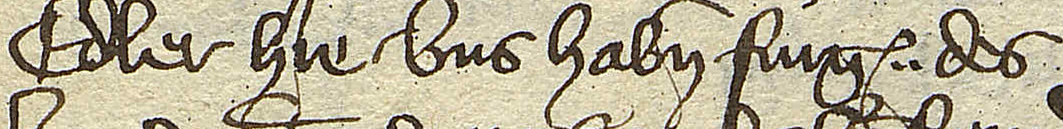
Edler h*re / vns habn* fürg* ~ des
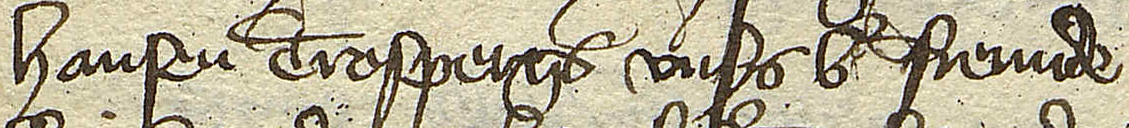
hanſen Troſpergs vnſ*s b* freunde
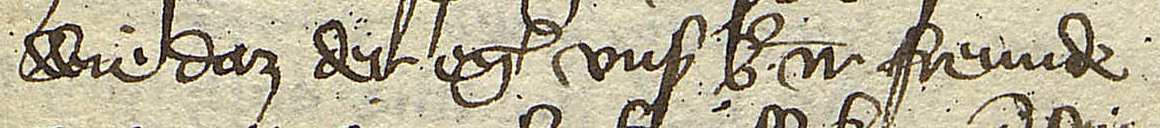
wie daʒ der eg* vnſ* b* ir freunde
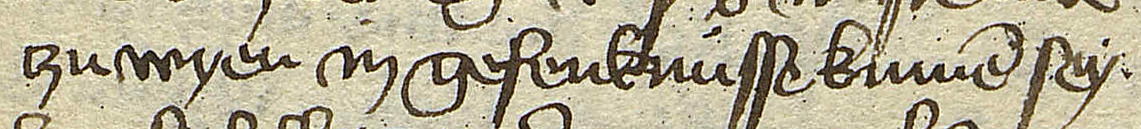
cʒu wyen in gefenknüſſe kume* ſey
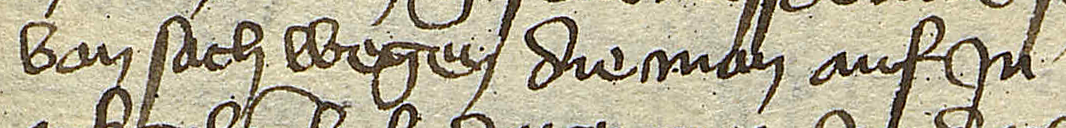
von ſach wegen die man auf In
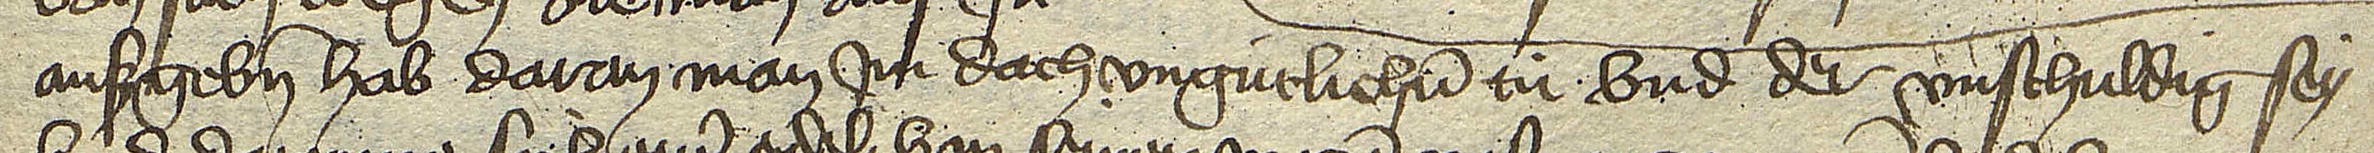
auſʒgebn* hab daran man Im doch vngütlichn* tü vnd der vnſchuldig ſey
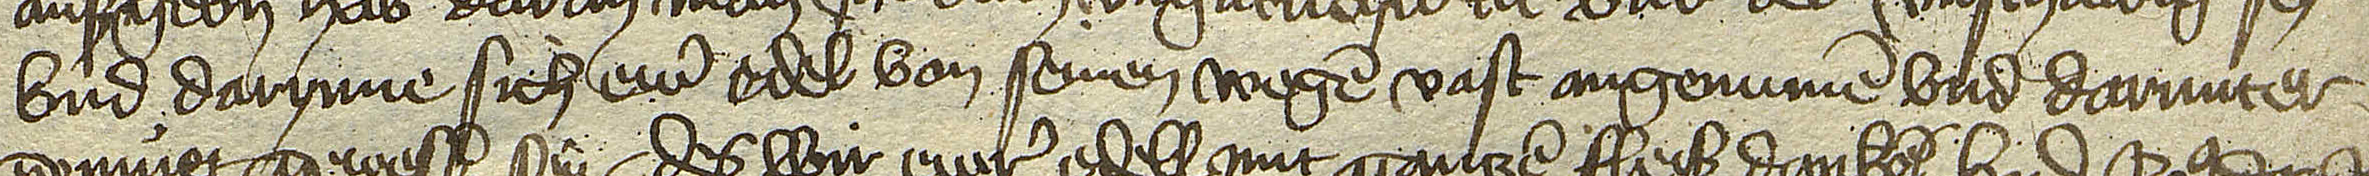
vnd darynne ſich ew* edel von ſeinen wege* vaſt angenume* vnd darunter
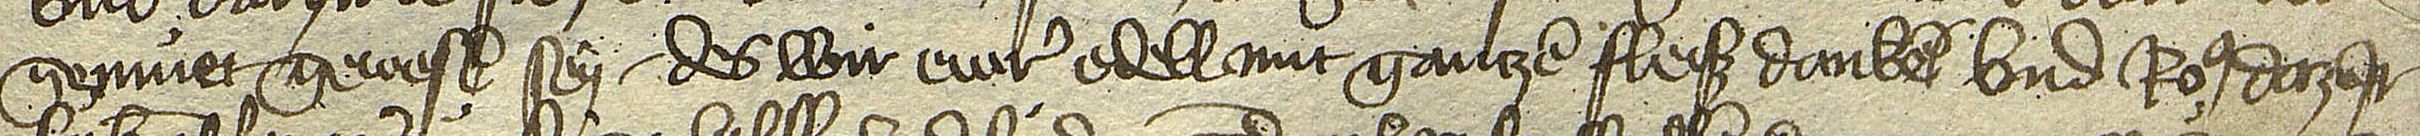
gemüet geweſe* ſey / des wir ewr* edell mit gancʒe* fleiſʒ danke* vnd Ro* daʒ Ir
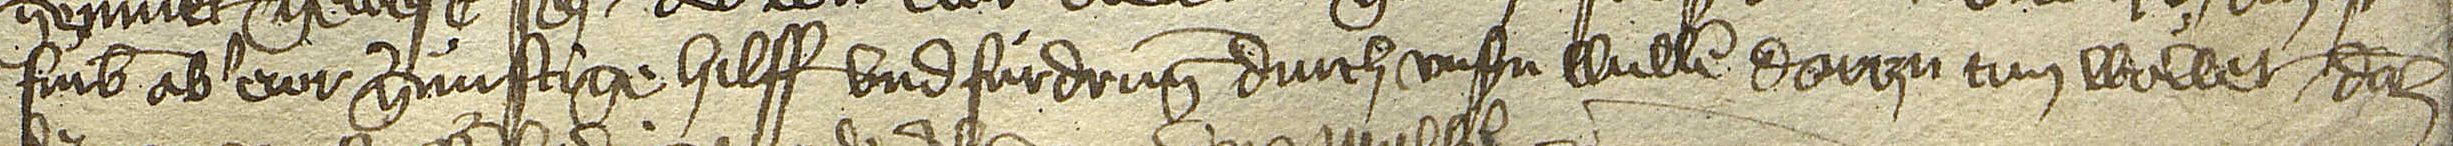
furb* ab* ewr günſtige hilff vnd fürdrug* durch vnſ*n wille* darcʒu tun wöllet / daʒ
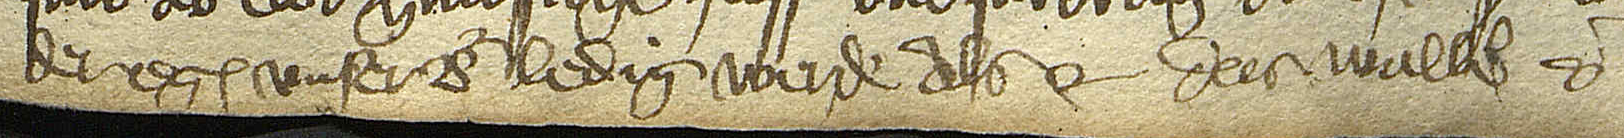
der eg* vnſer B* ledig werde Als ec* das wolle* ec*
